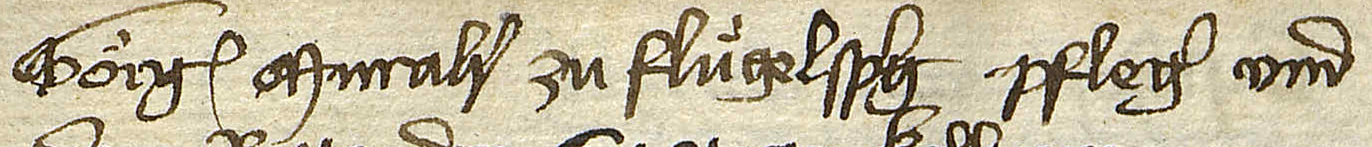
Görg* Murah* ʒu flügelſp*g . pfleg* vnd
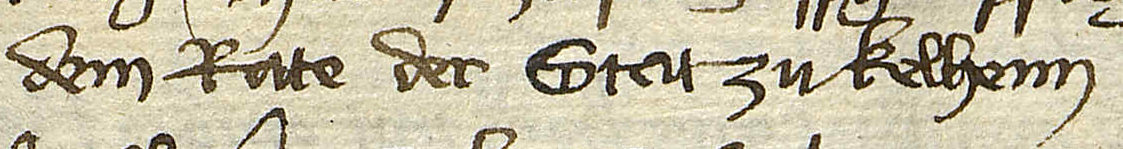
dem Rate der Stat ʒu kelheim
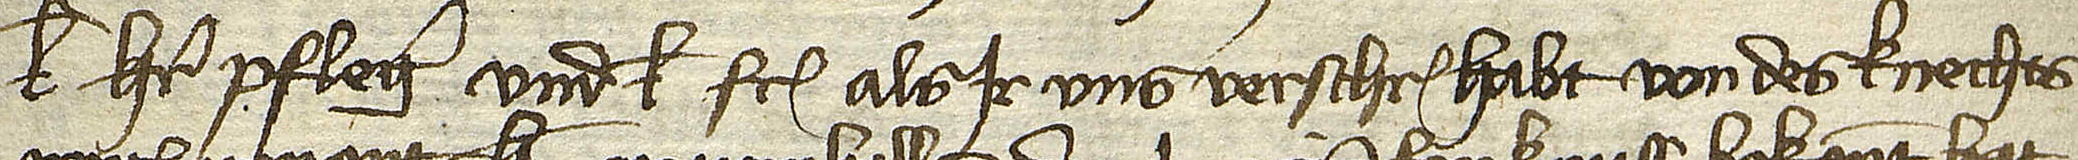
L* h*r pfleg* vnd l* fr* als Ir vns verſchr* habt von des knechts
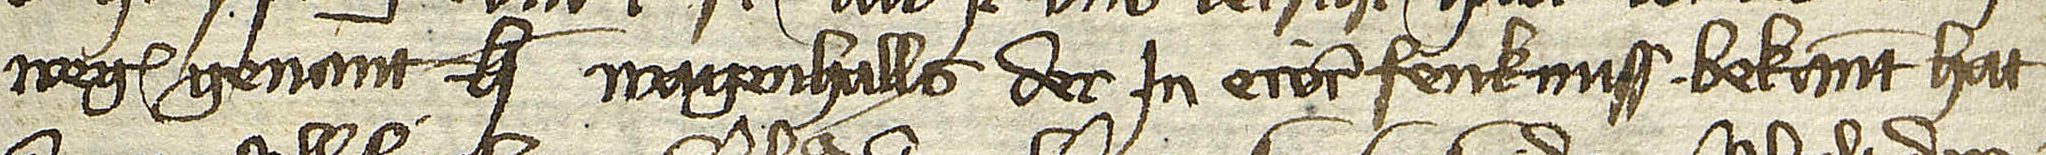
weg* genant h* wagenhalls der In eẅr* fenknuſſ . bekant* hat
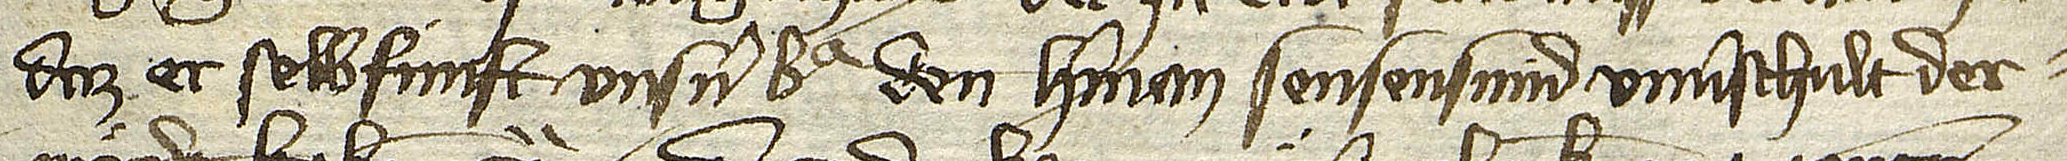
daʒ er ſelbfimft vnſ*n b* den h*man ſenſenſmid vnu*ſchult der =
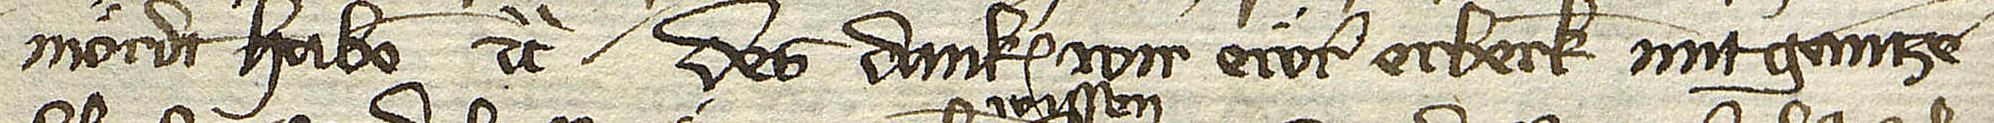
mördt habe* ec* / Des dank* wir eẅr* erberk* mit gancʒe*
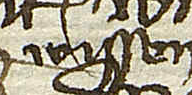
wiſſen
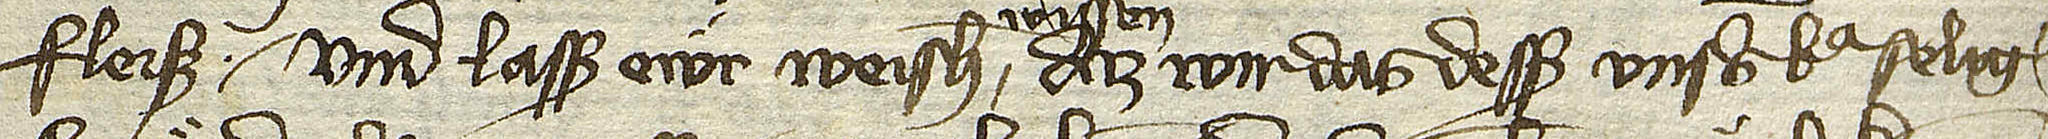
fleiſʒ / vnd laſſ* eẅr weiſh* / daʒ wir das deſſ* vnſ*s b* ſelig*
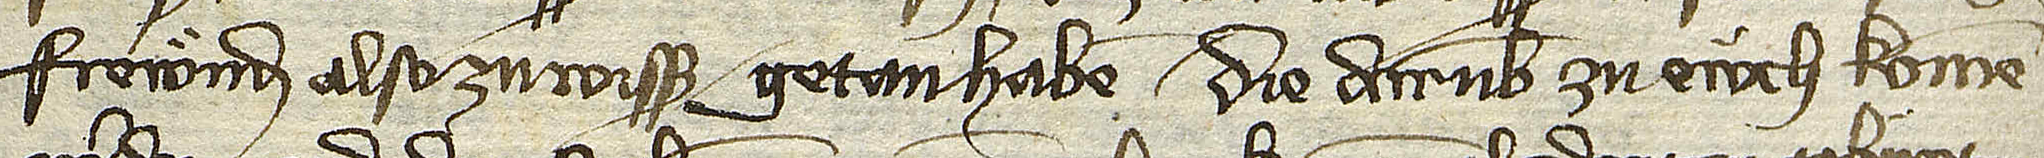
freẅnd* alſo ʒu wiſſ* / getan habe* / die darub* ʒu eẅch kome*
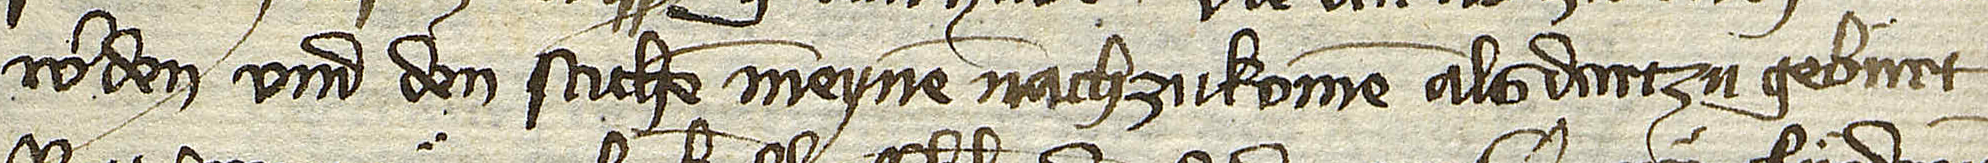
w*den vnd den ſache* meyne* nachʒukome* als darcʒu gebürt
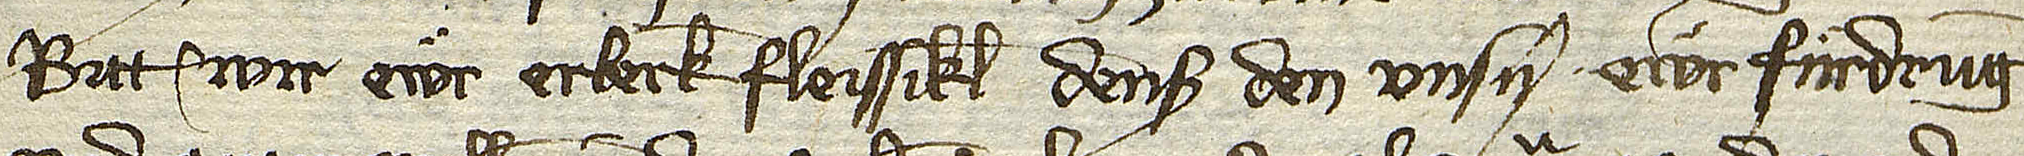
Bitt* wir eẅr erberk* fleiſſikl* denſ* den vnſ*n eẅr fürdrug*
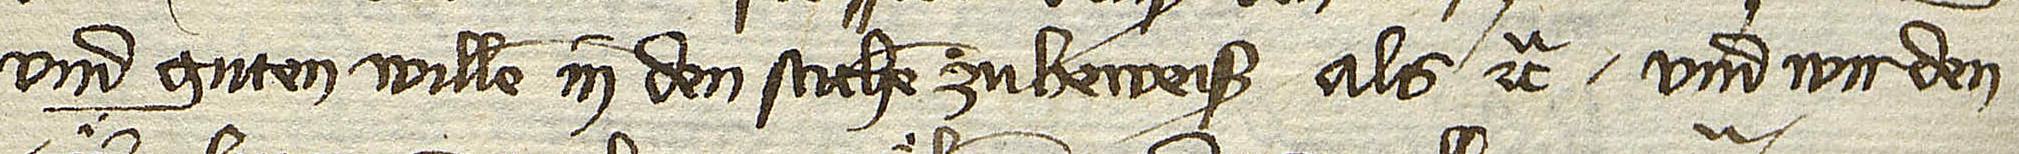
vnd guten wille* in den ſache* ʒu beweiſ* als ec* / vnd wir den
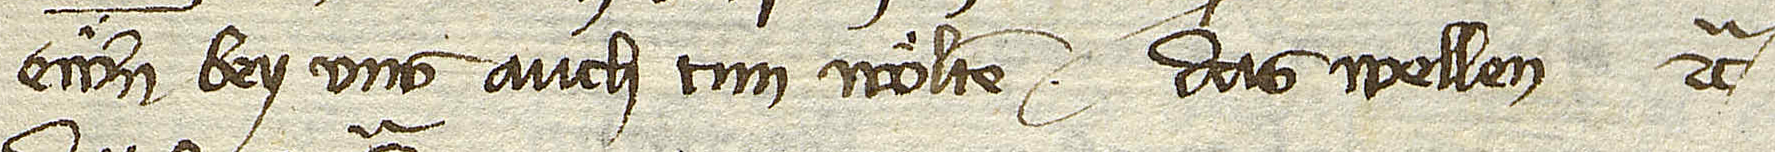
eẅ*n bey vns auch tun wölte* das wellen ec*
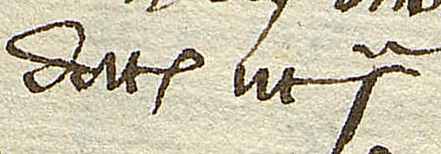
Dat* ut ſ*
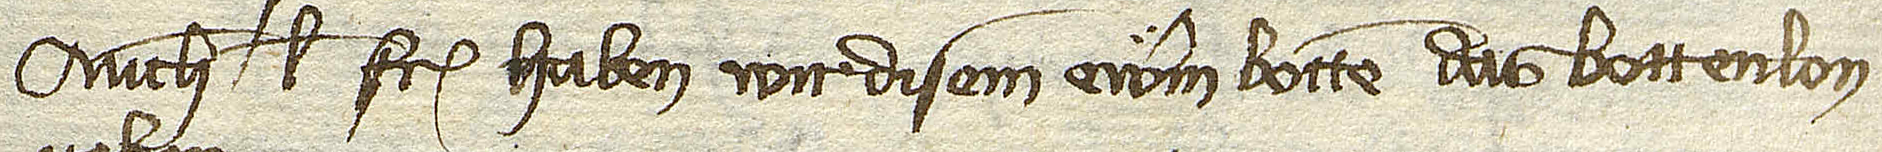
Auch l* fr* haben wir diſem eẅ*m botte* das bottenlon
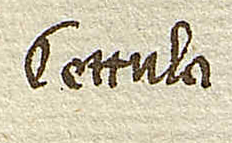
Cettula
